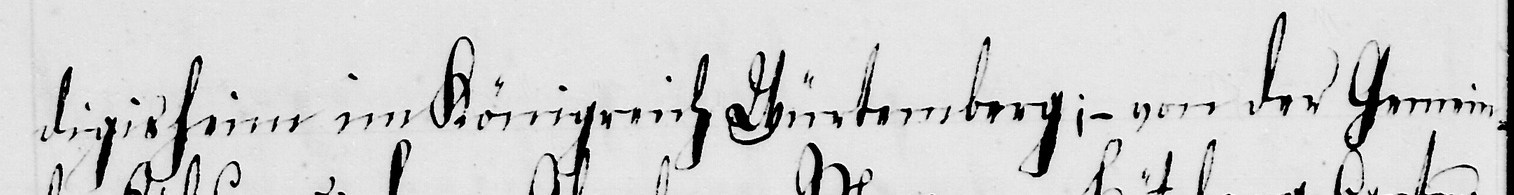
digisheim im Königreich Würtemberg; – von der Gemein¬
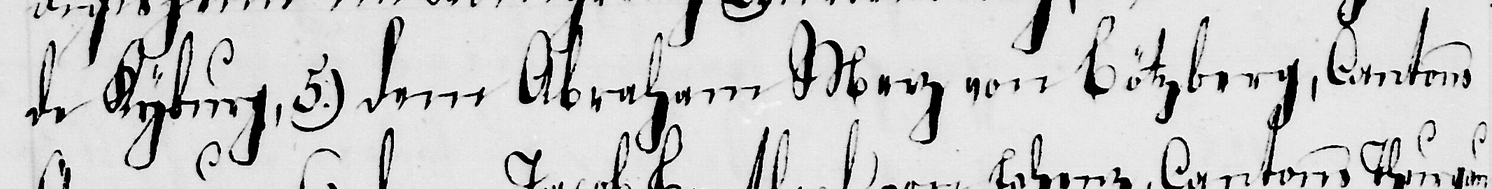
de Kyburg, 5.) dem Abraham Mez von Bötzberg, Cantons
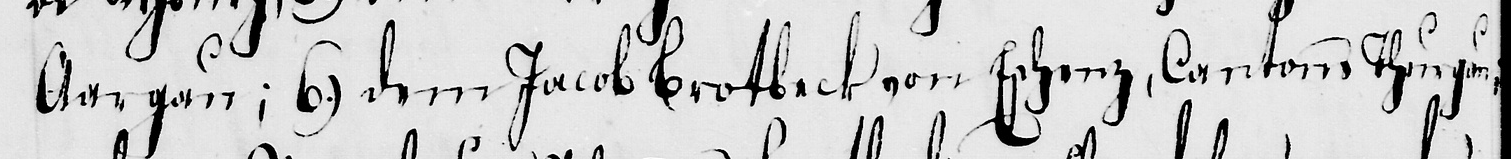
Aargau; 6.) dem Jacob Brotbeck von Eschenz, Cantons Thurgau;
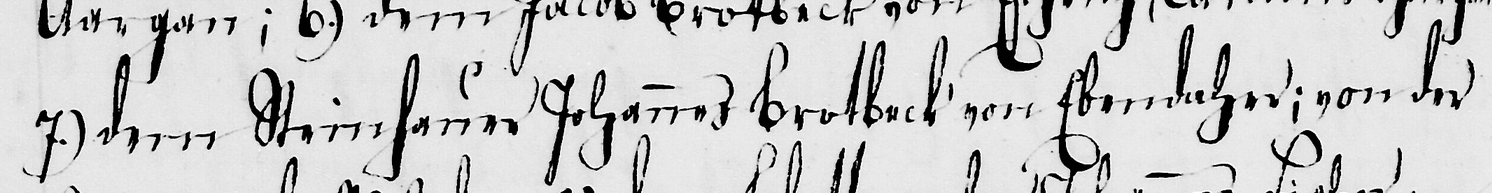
7.) dem Steinhauer Johannes Brotbeck von Ebendaher; von der
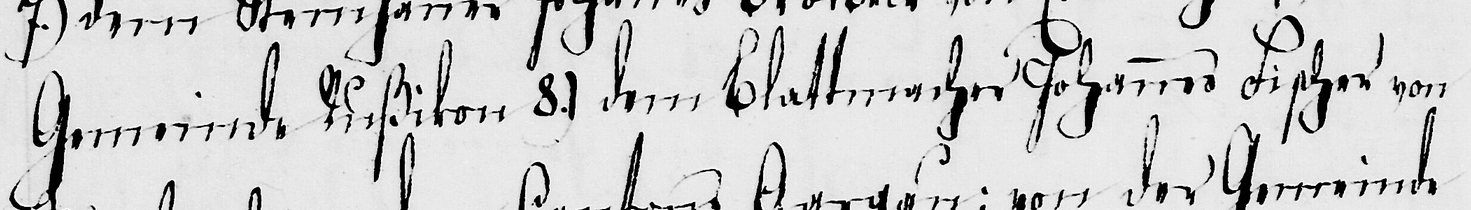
Gemeinde Rußikon 8.) dem Blattmacher Johannes Fischer von
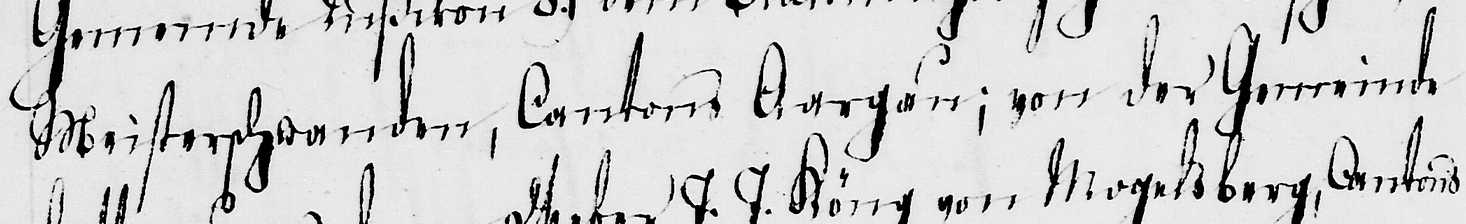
Meisterschwanden, Cantons Aargau; von der Gemeinde
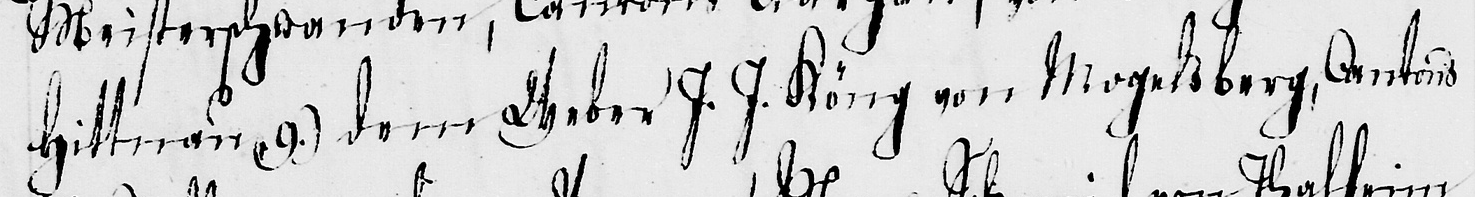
Hittnau 9.) dem Weber J. J. Köng von Mogelsberg, Cantons
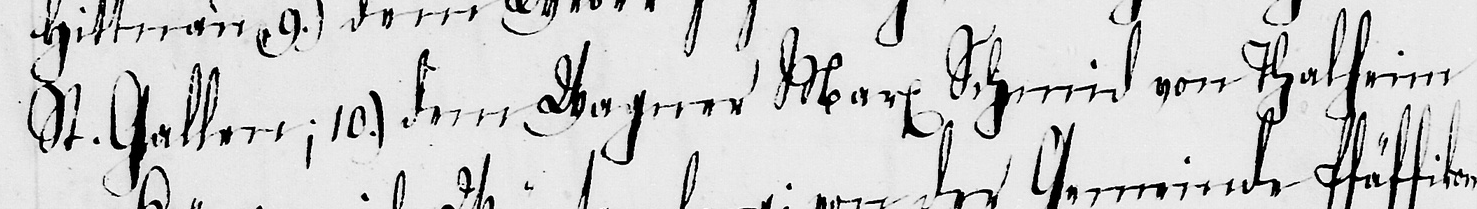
St. Gallen; 10.) dem Wagner Marx Schmid von Thalheim
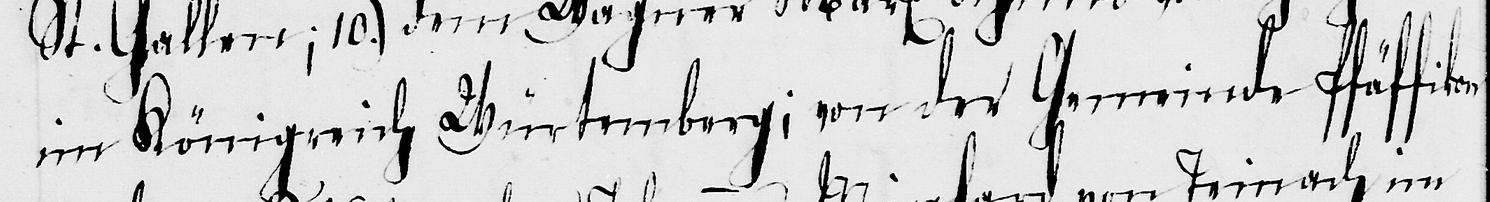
im Königreich Würtemberg; von der Gemeinde Pfäffik¬
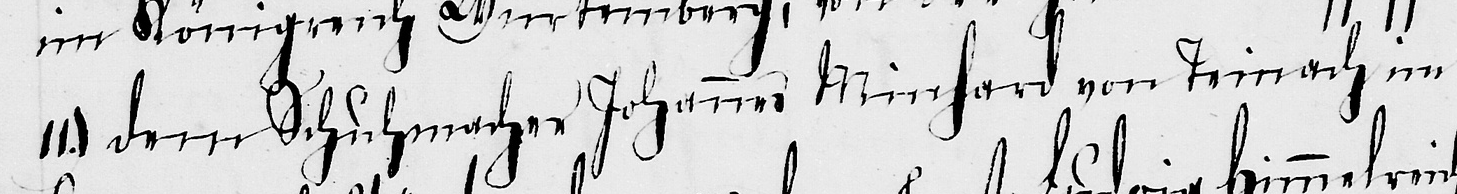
11.) dem Schuhmacher Johannes Minhard von Teinach im
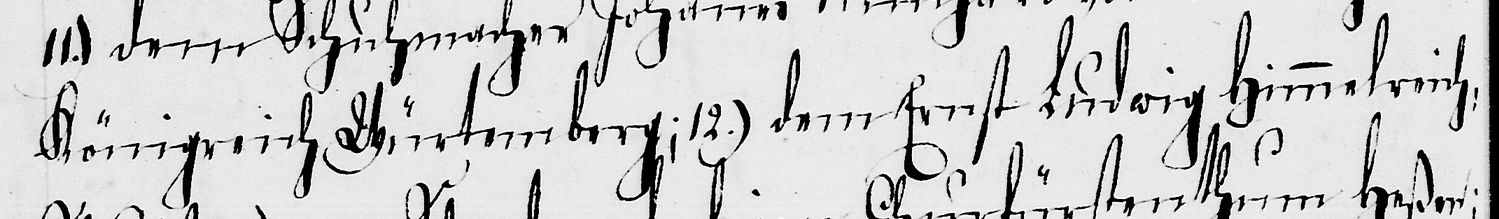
Königreich Würtemberg; 12.) dem Ernst Ludwig Himmelreich,
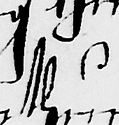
7.
